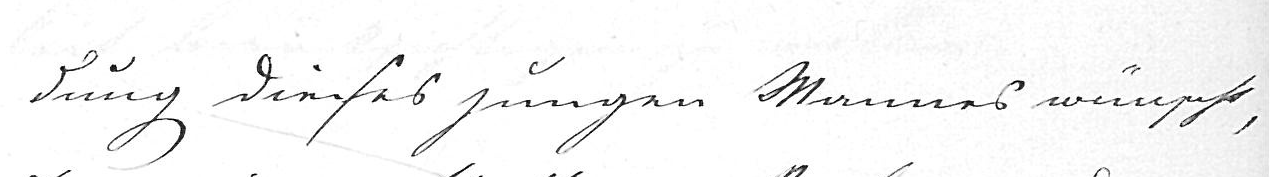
dung dieses jungen Mannes wünscht,
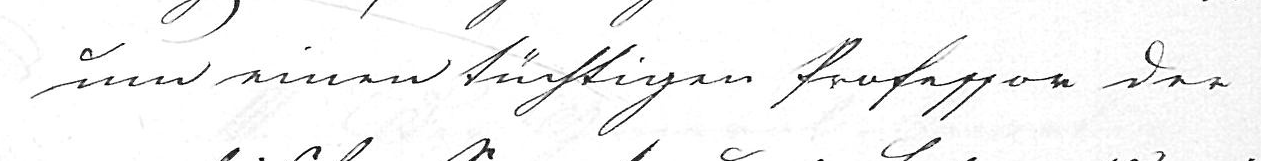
und einen tüchtigen Professor der
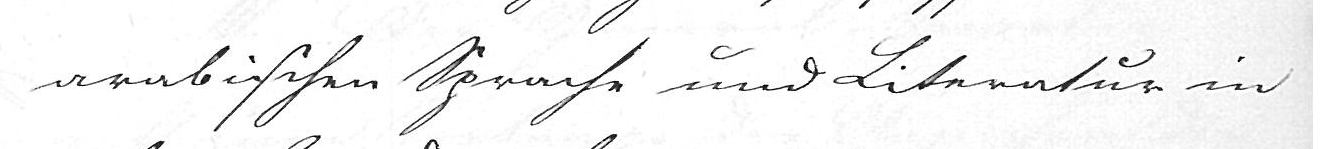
arabischen Sprache und Literatur in
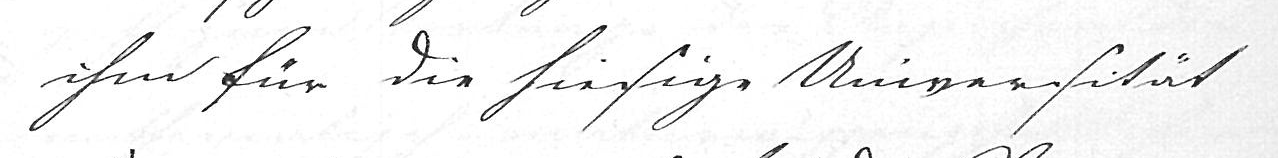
ihm für die hiesige Universität
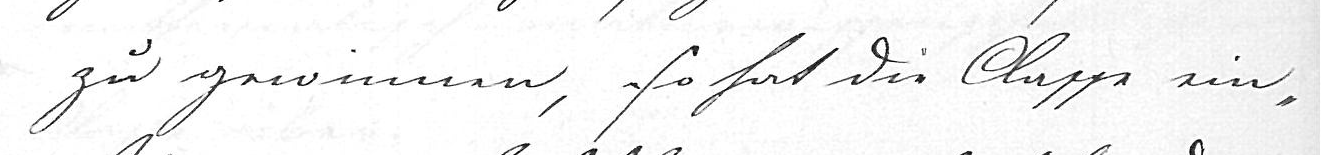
zu gewinnen, so hat die Classe ein-
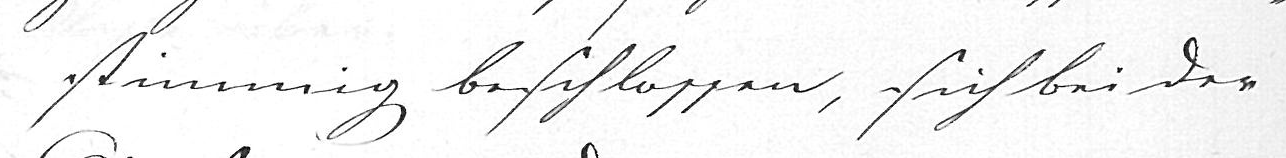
stimmung beschlossen, sich bei der
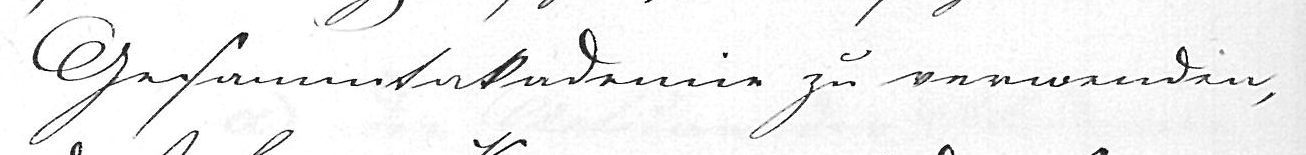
Gesammtakademie zu verwenden,
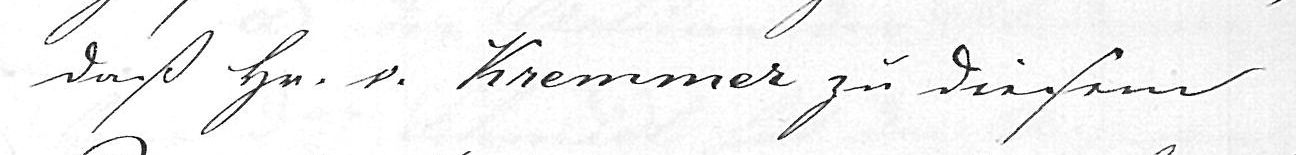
daß Hr. v. Kremmer zu diesem
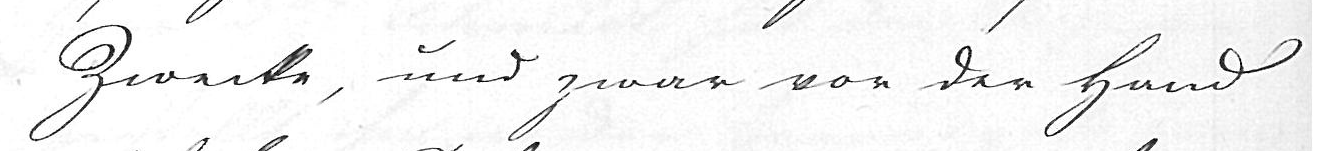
Zwecke, und zwar vor der Hand
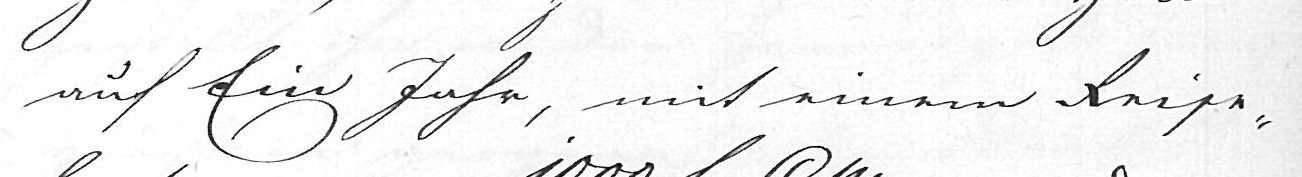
auf Ein Jahr, mit einem Reise-
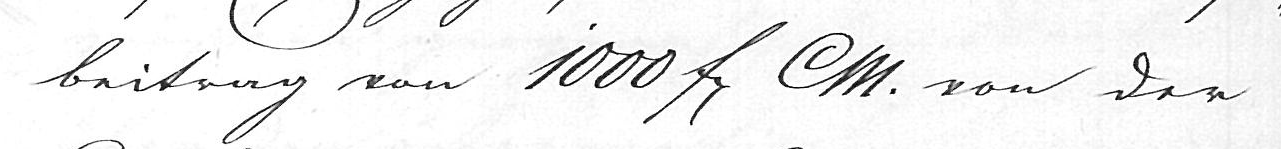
beitrag von 1000 f. CM. von der
